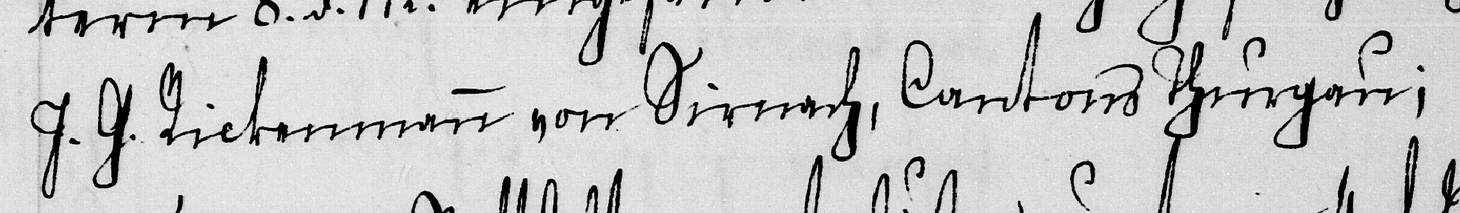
J. G. Rickenmann von Sirnach, Cantons Thurgau;
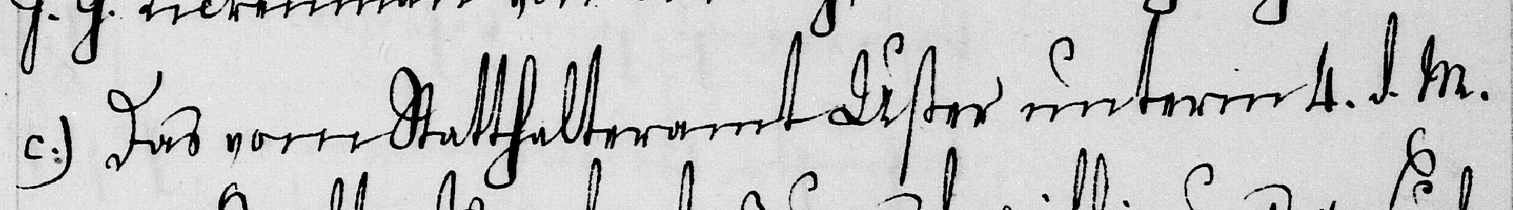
c.) Das vom Statthalteramt Uster unterm 4. d. M.
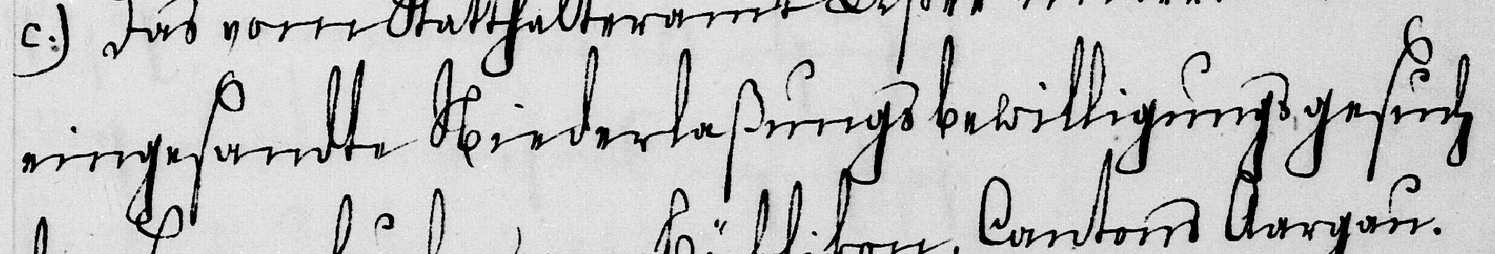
eingesandte Niederlaßungsbewilligungsgesuch
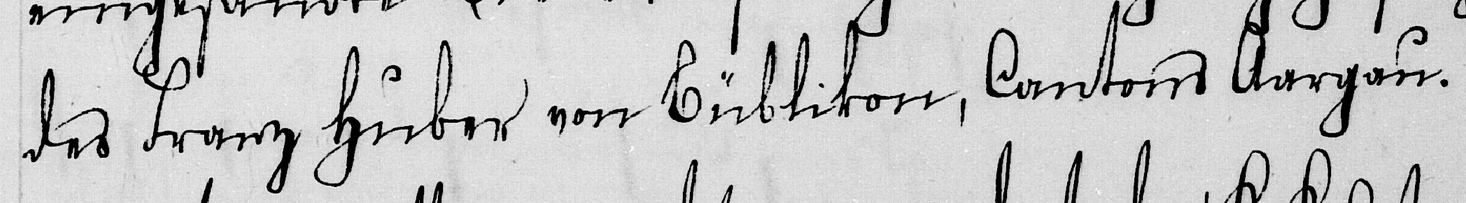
des Franz Huber von Büblikon, Cantons Aargau.
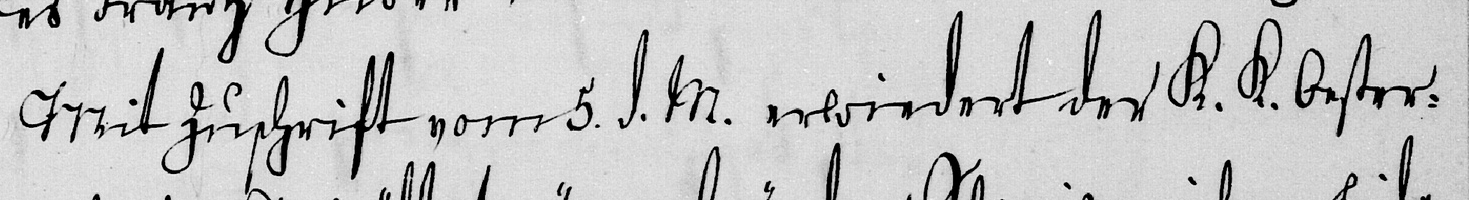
Mit Zuschrift vom 5. d. M. erwiedert der K. K. Oester¬
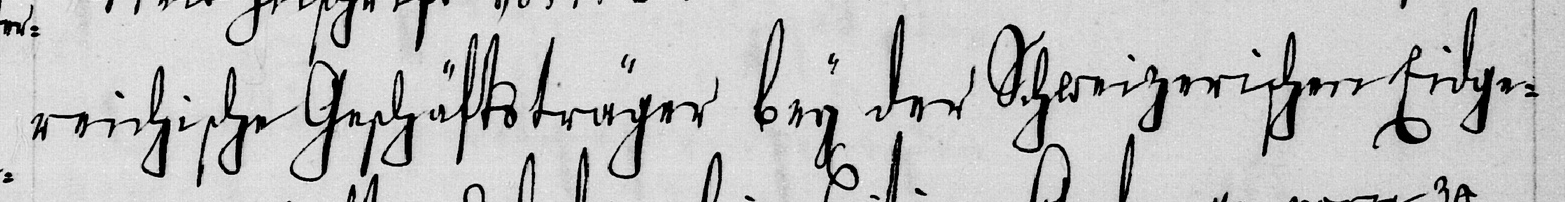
reichische Geschäftsträger bey der Schweizerischen Eidge¬
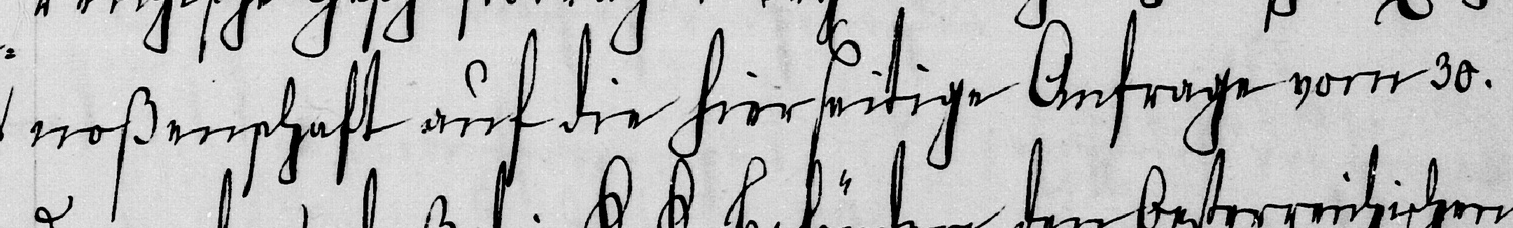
noßenschaft auf die hierseitige Anfrage vom 30.
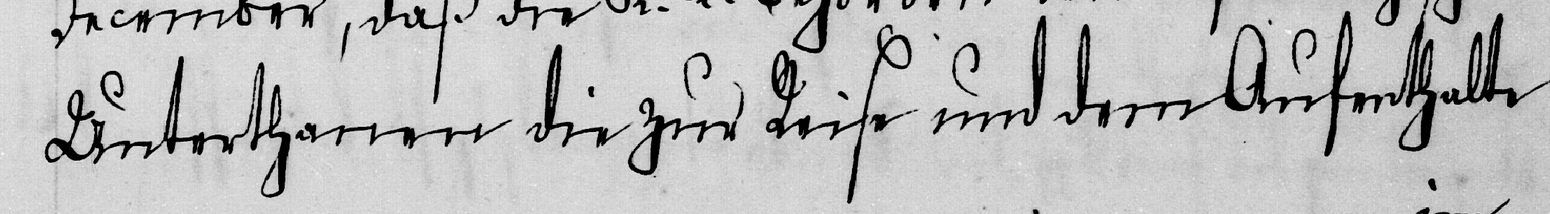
Unterthanen die zur Reise und dem Aufenthalte
